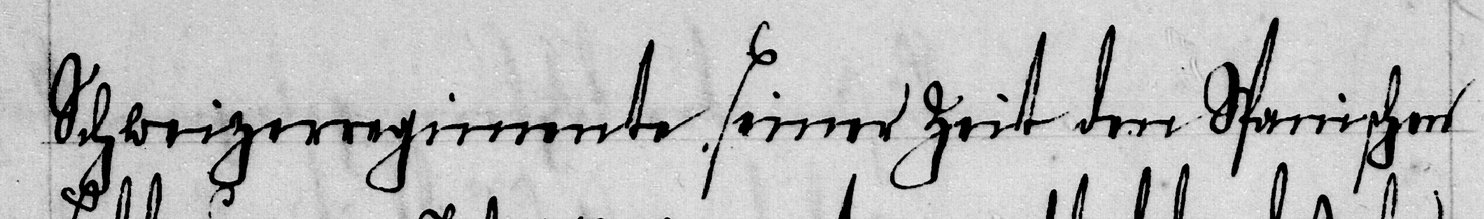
Schweizerregimente seiner Zeit den Spanischen
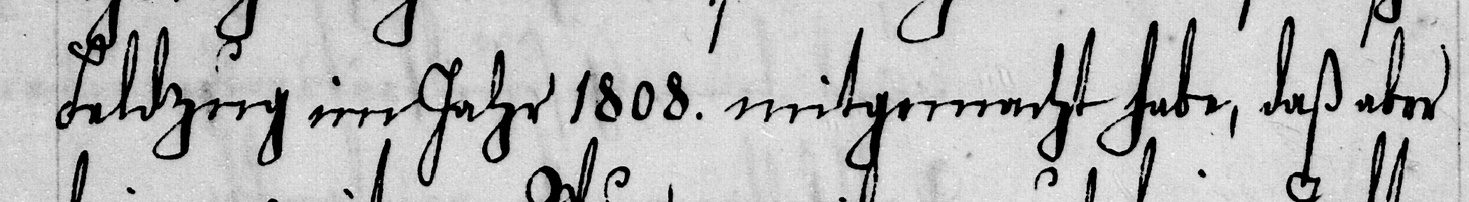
Feldzug im Jahr 1808. mitgemacht habe, daß aber
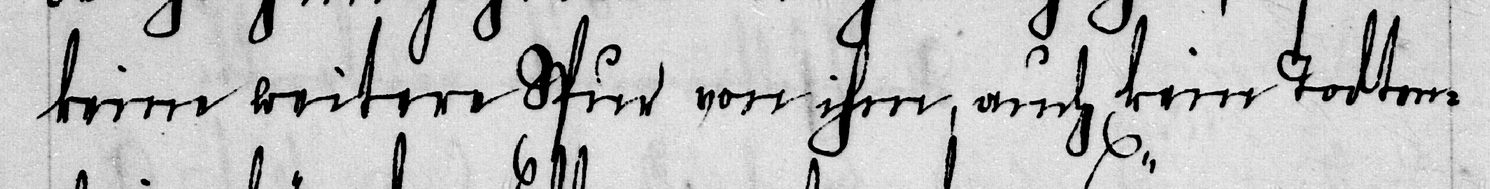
keine weitere Spur von ihm, auch kein Todten¬
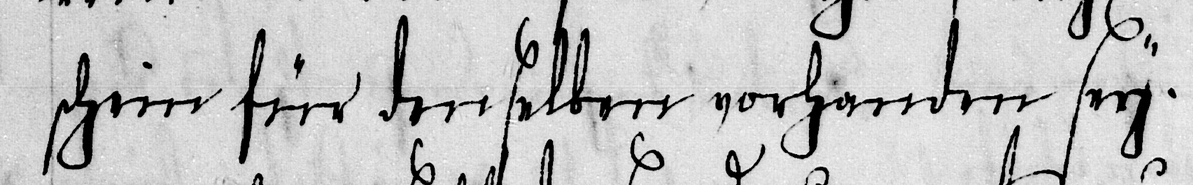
schein für denselben vorhanden sey.
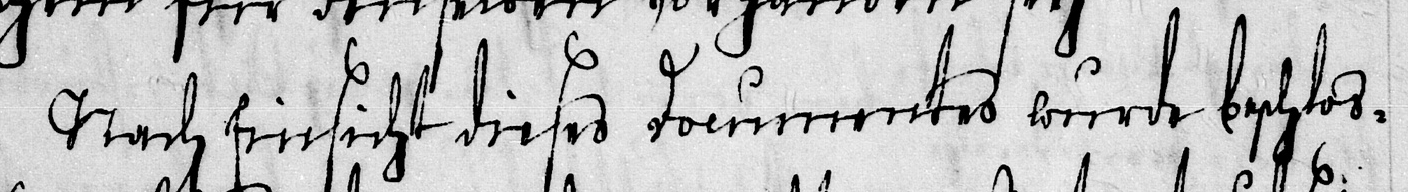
Nach Einsicht dieses Documentes wurde beschloß¬
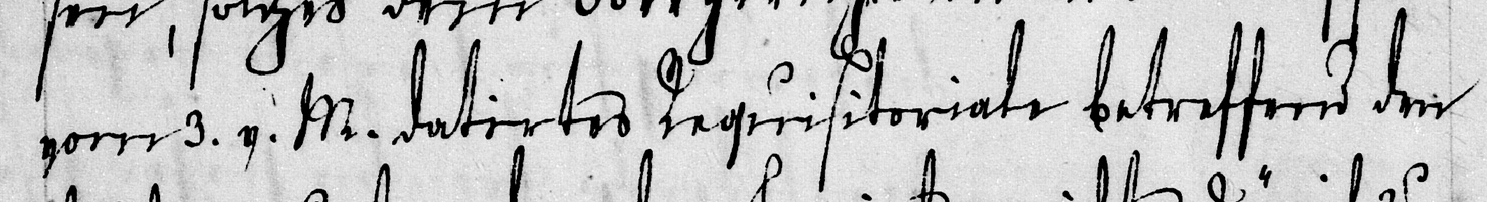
vom 3. v. M. datirtes Requisitoriale betreffend den
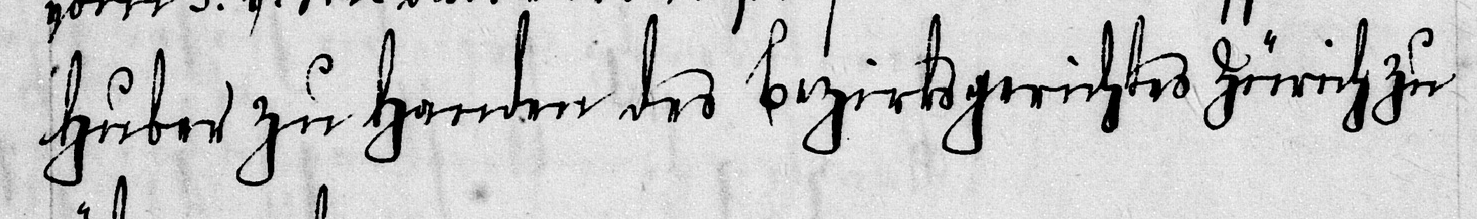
Huber zu Handen des Bezirksgerichtes Zürich zu
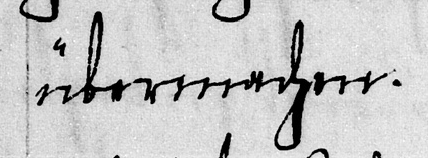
übermachen.
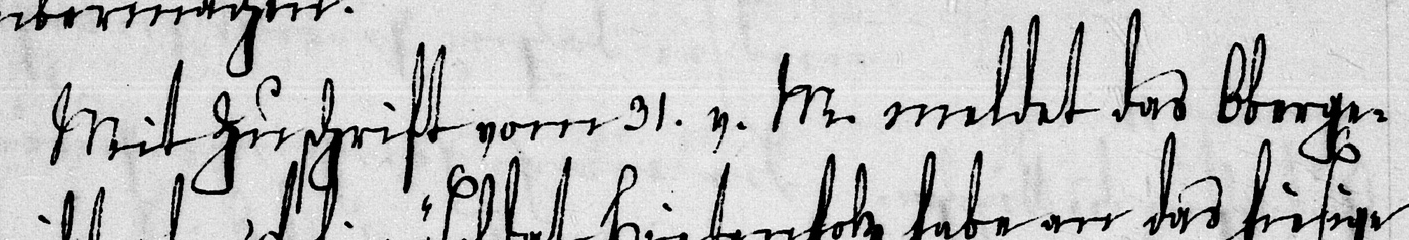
Mit Zuschrift vom 31. v. M. meldet das Oberge¬
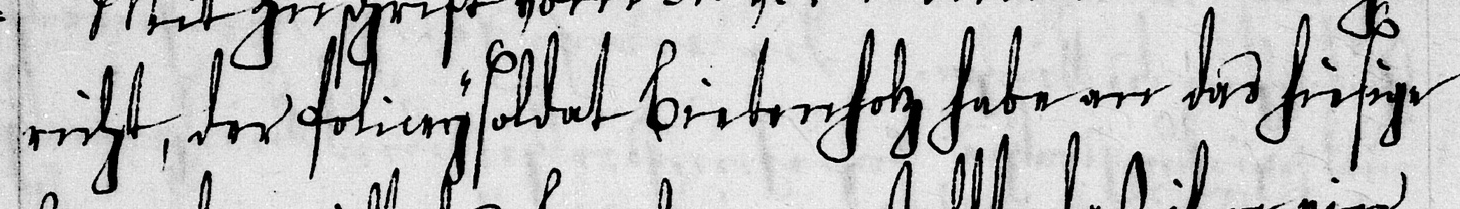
richt, der Policeysoldat Bietenholz habe an das hiesige
